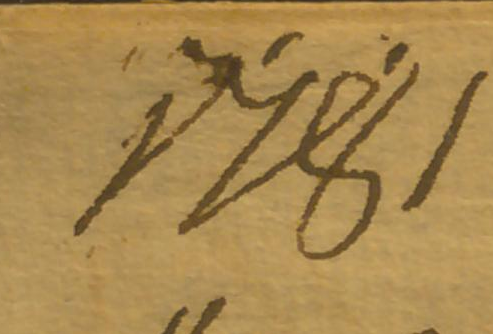1781
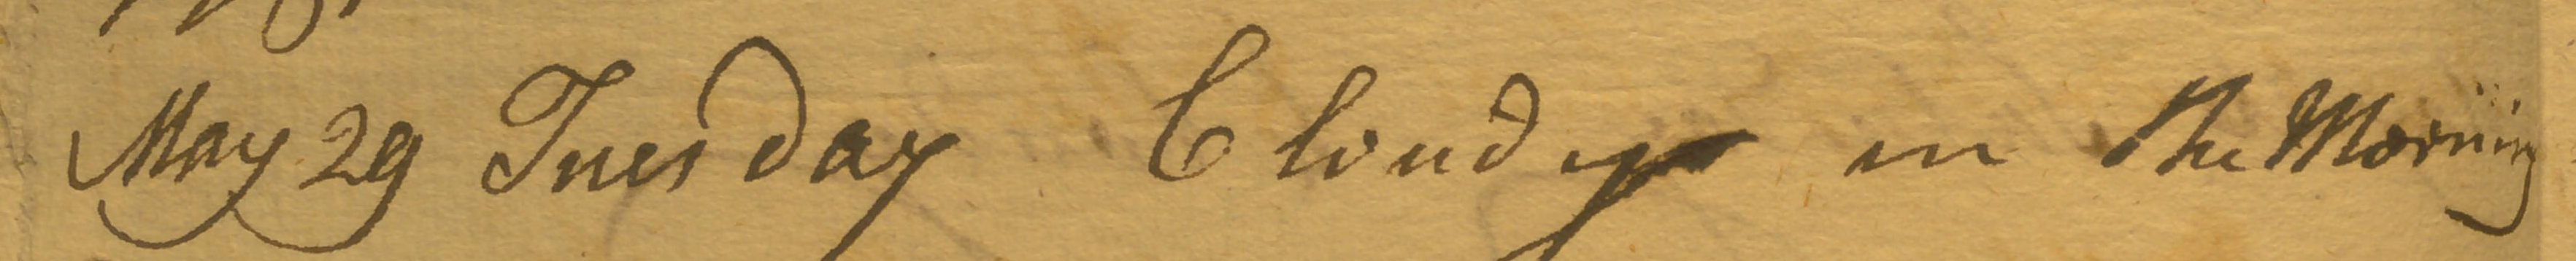May 29 Tuesday Cloudy in the Morning
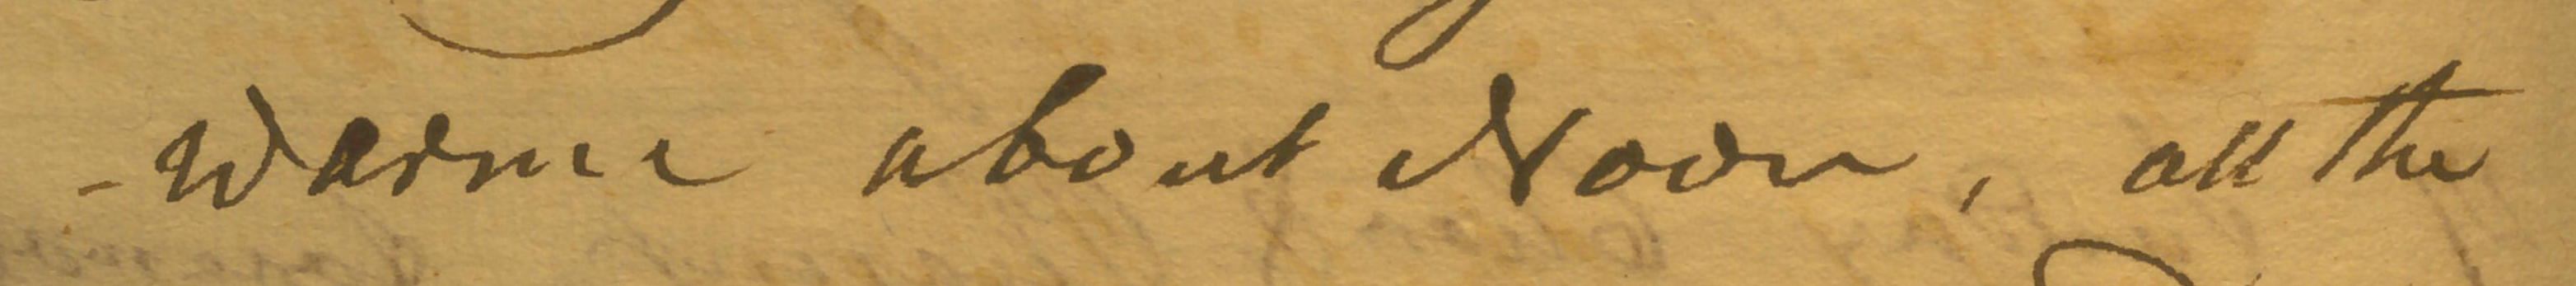Warme about Noon, all the
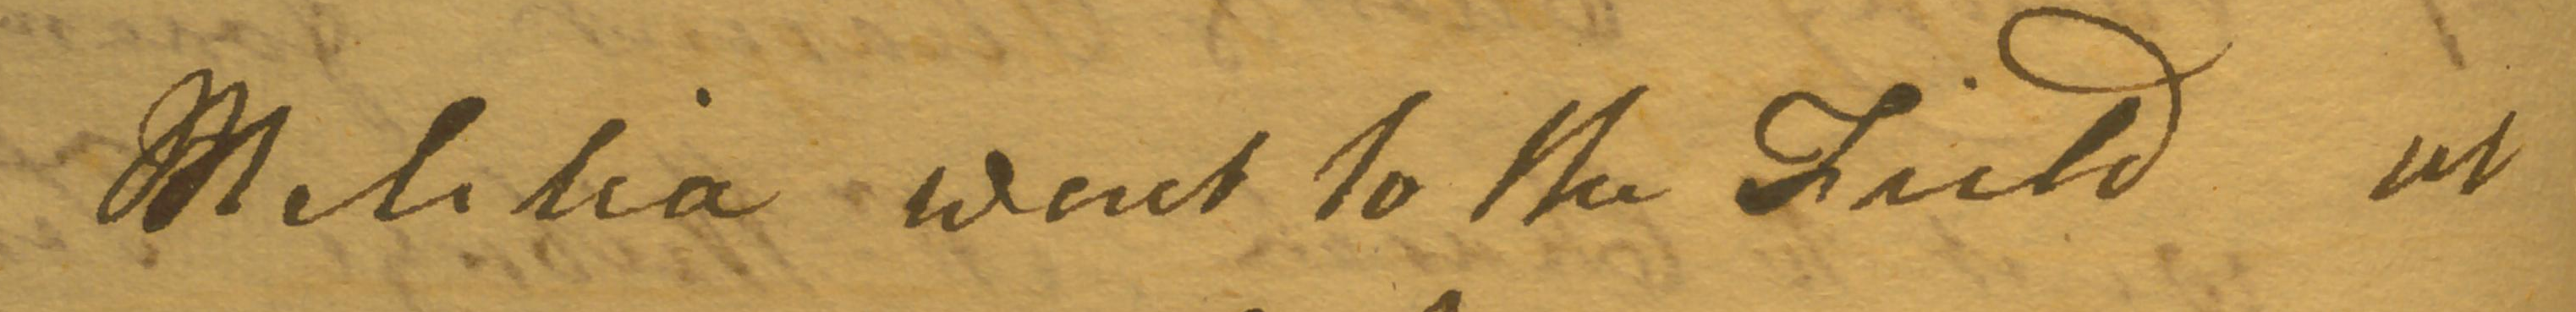Melilia went to the Field, at
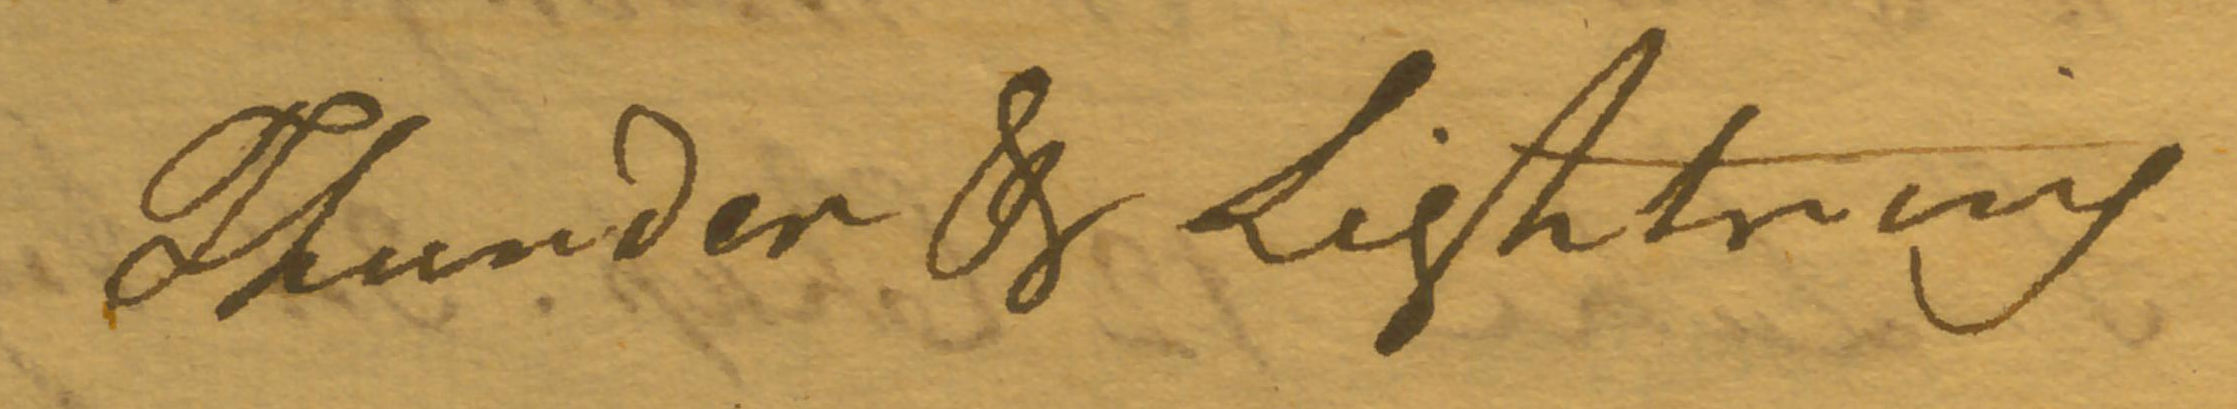Thunder & Lightning
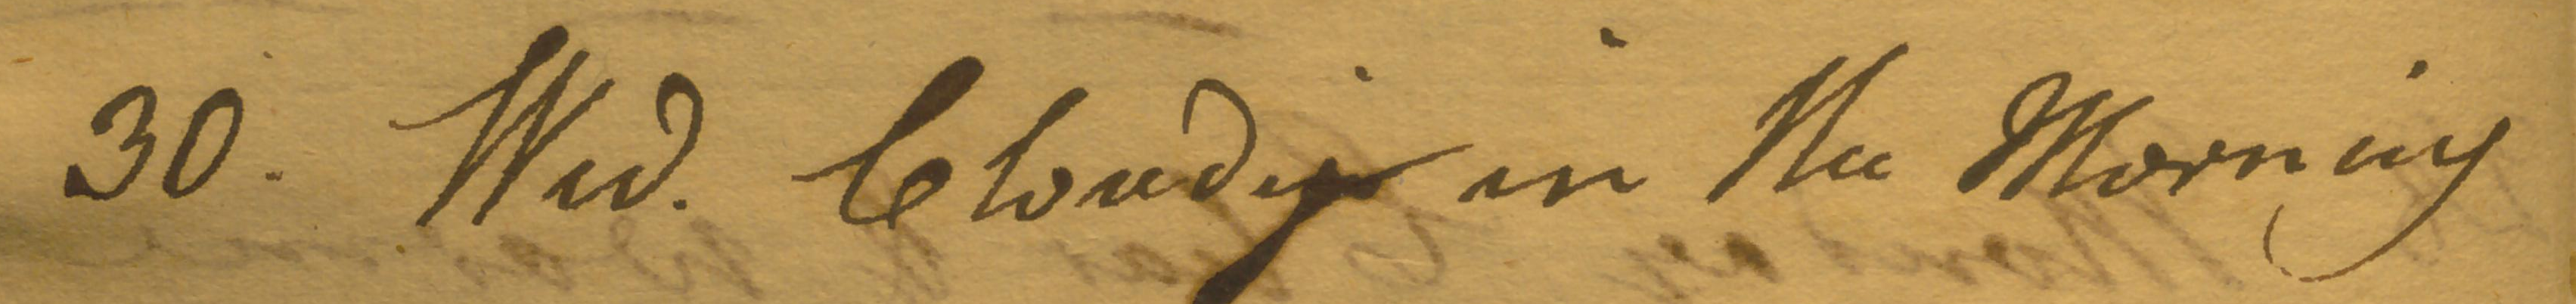30. Wed. Cloudy in the Morning
